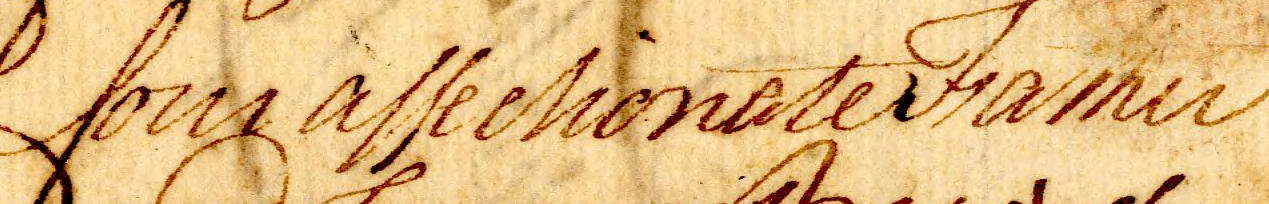Your affectionate Father
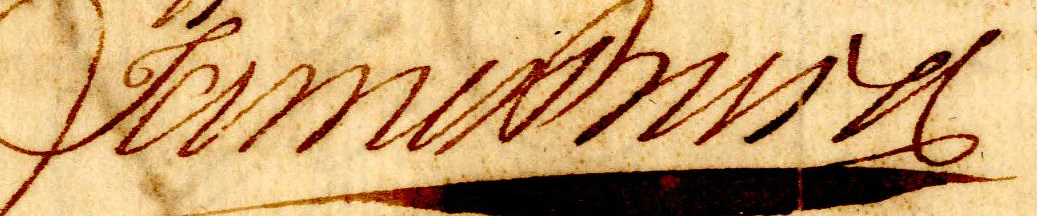James Burd
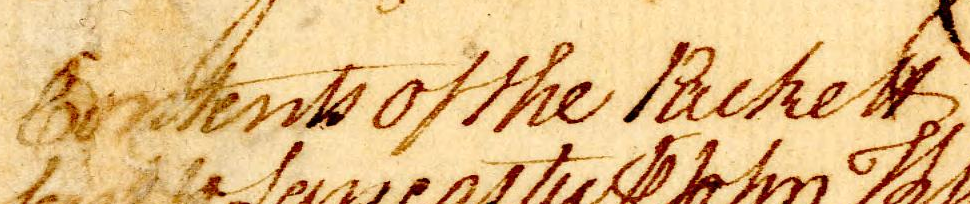Contents of the Packett
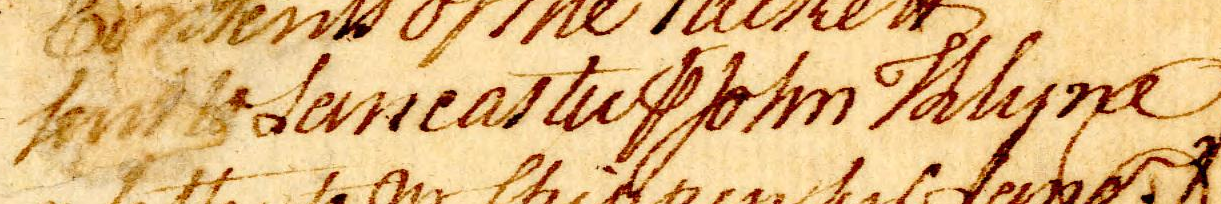sent to Lancaster per John Wyne
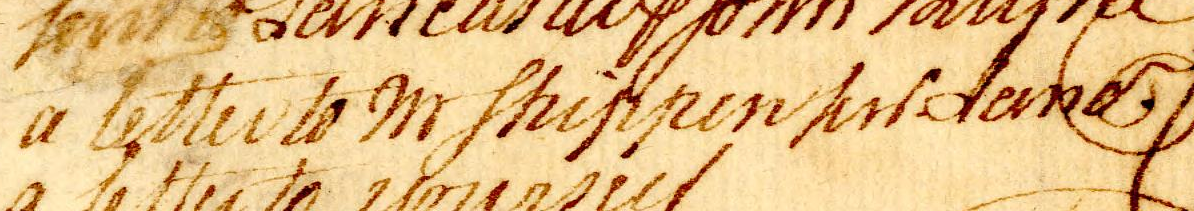a letter to M^r Shippen proland
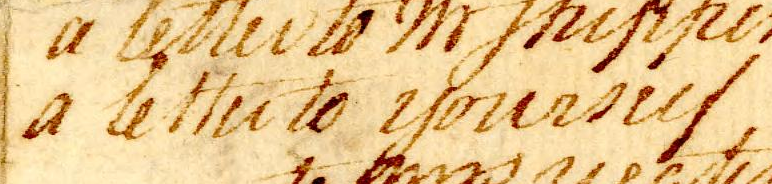a letter to yourself
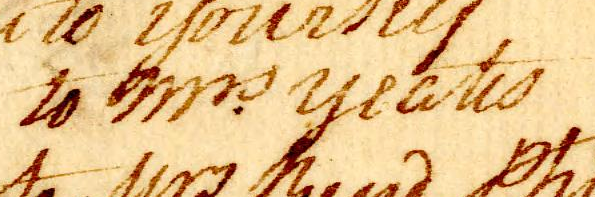to M^rs. Yeates
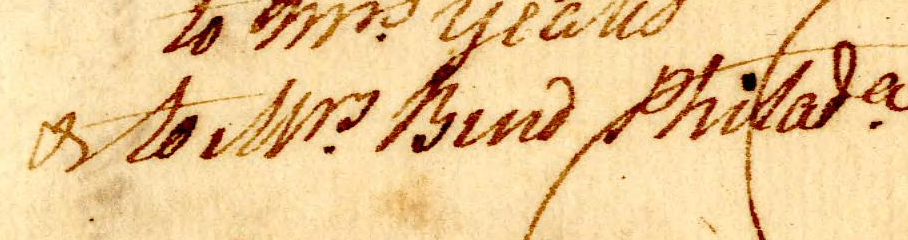& to M^rs. Bend Philad^a.
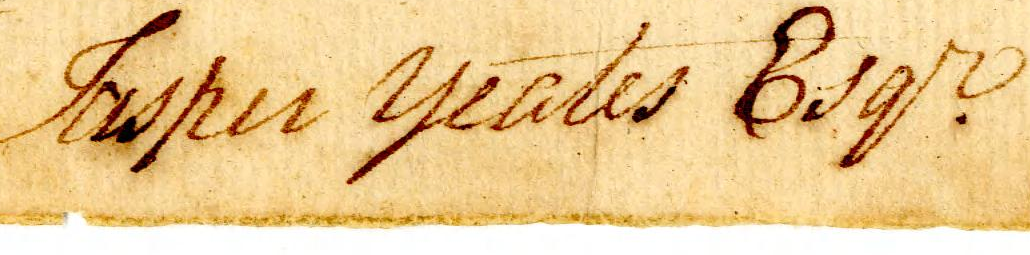Jasper Yeates Esq^r.
